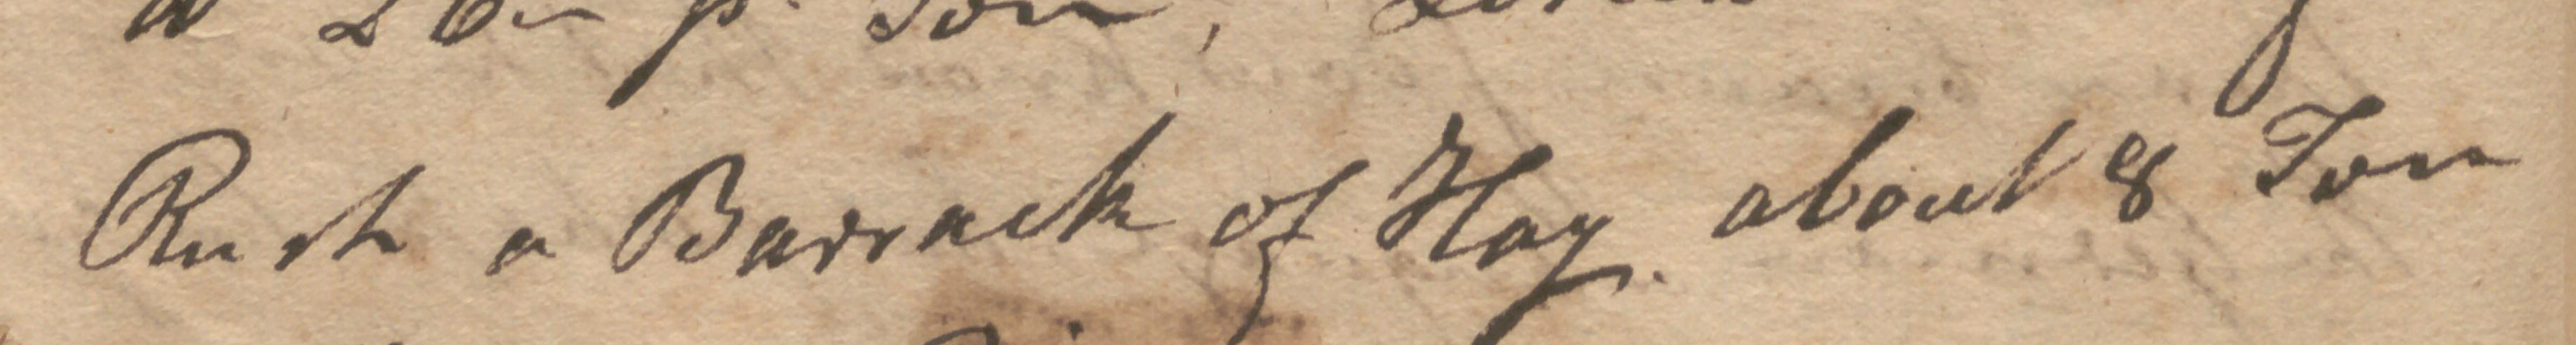Rech a Barrack of Hay about 8 Ton
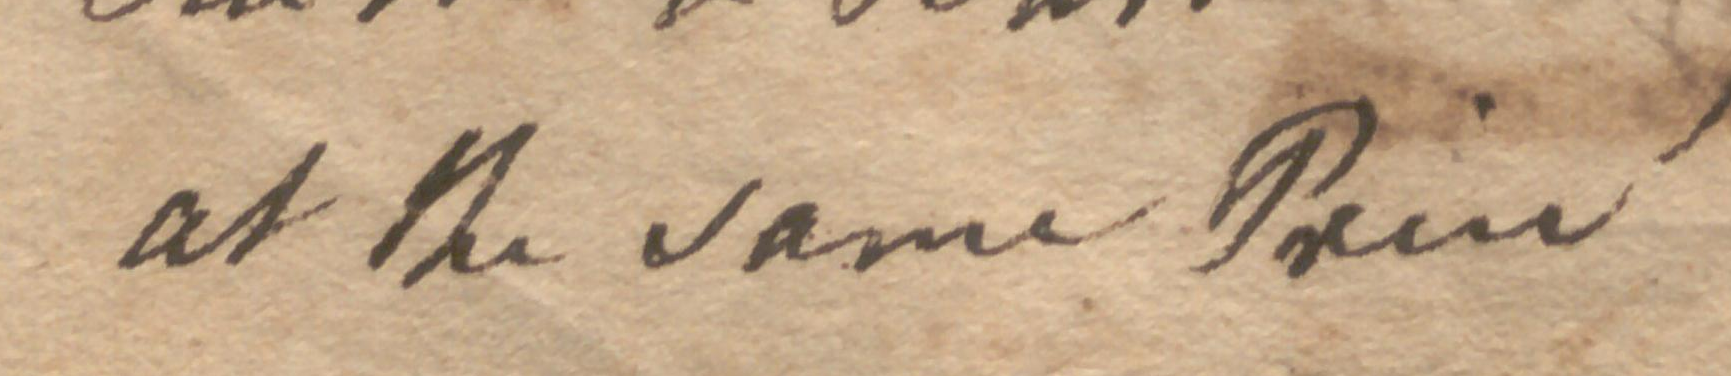at the same Price
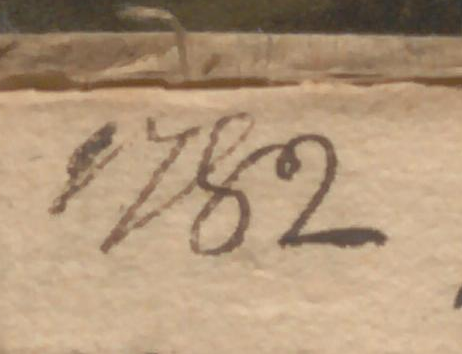1782
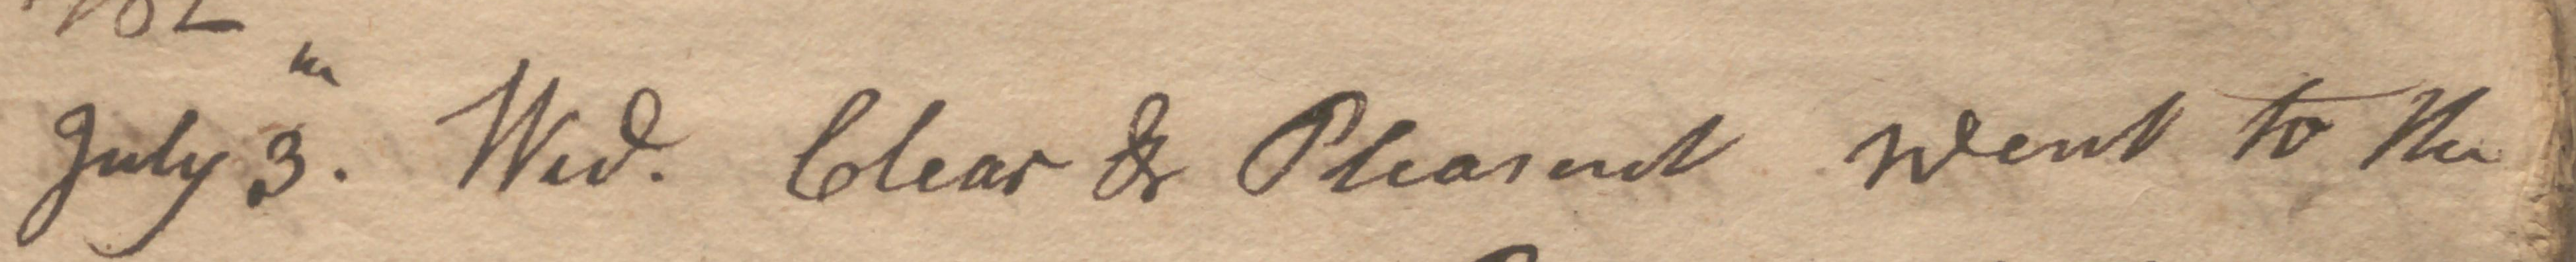July 3^h. Wed. Clear & Pleasent went to the
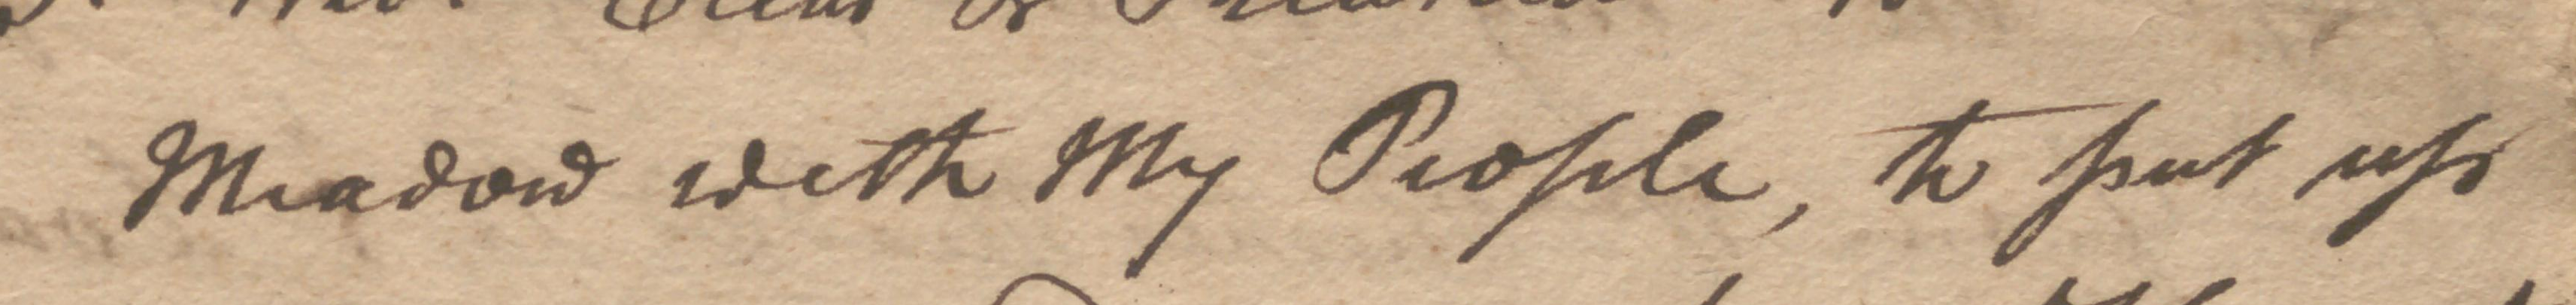Meadow with My People, to put up
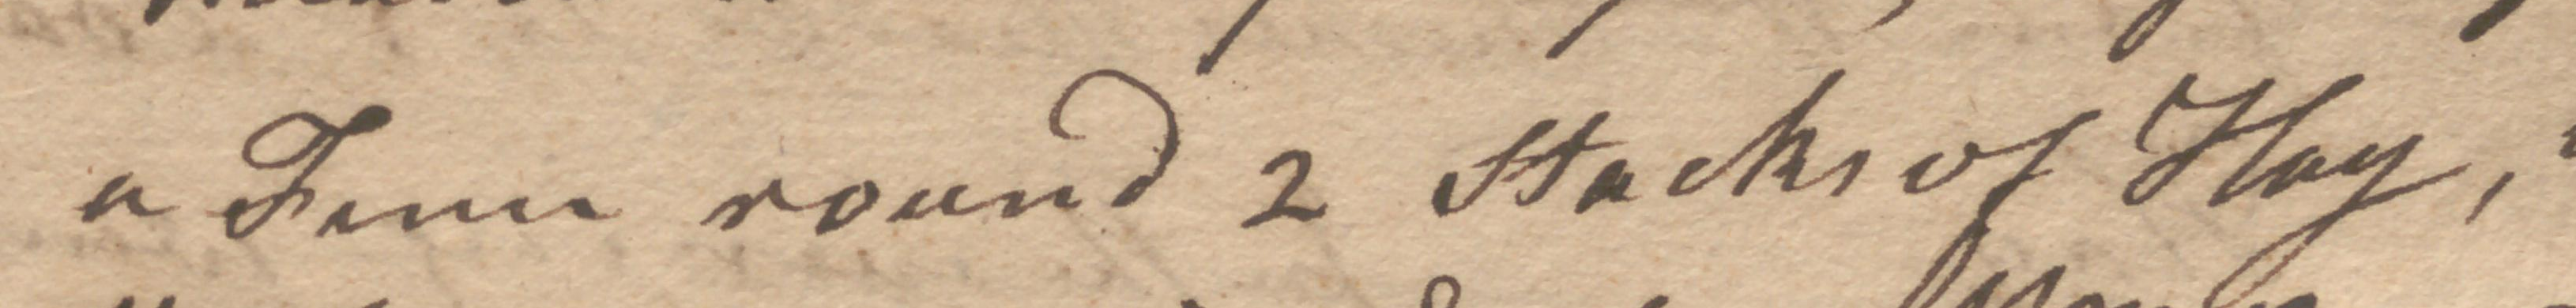a Fence round 2 Stacks of Hay,
